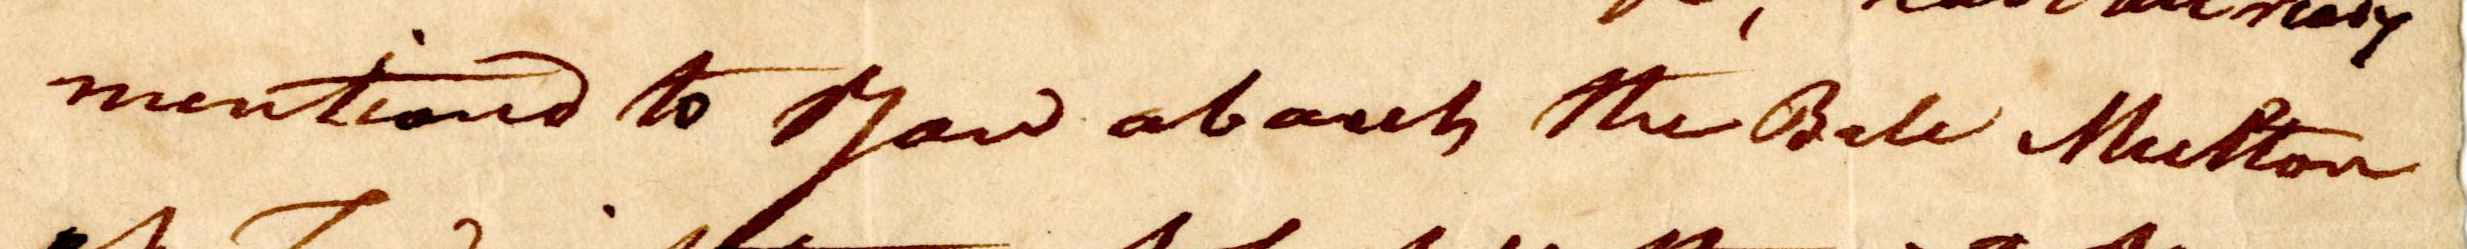mentioned to you about the Bell Mutton
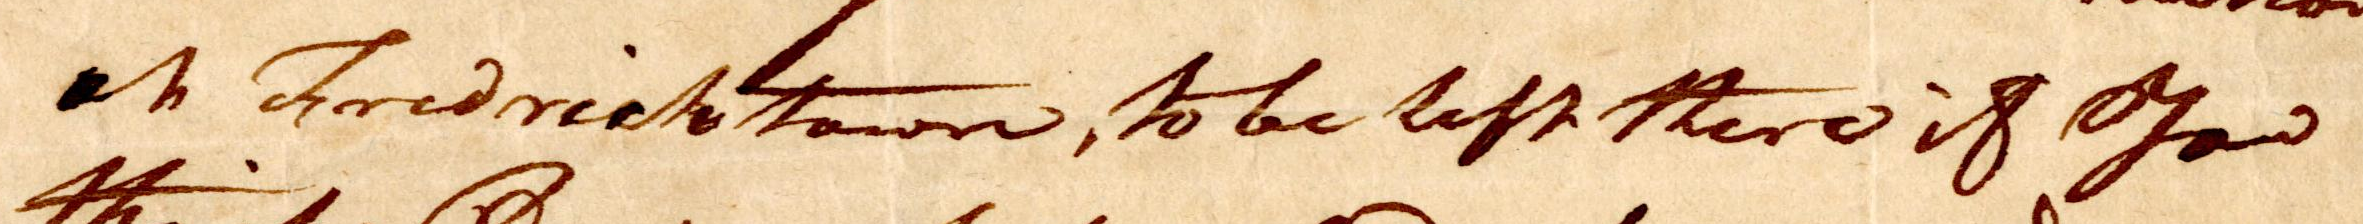at Fredrickstown, to be left there if you
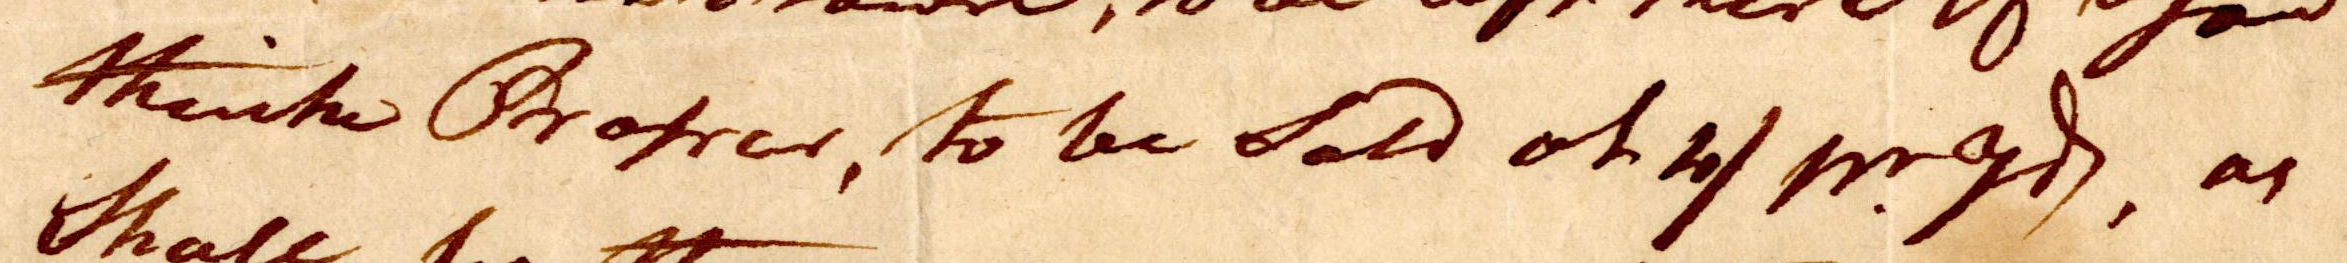thinke Proper, to be sold of 4s per y^d, as
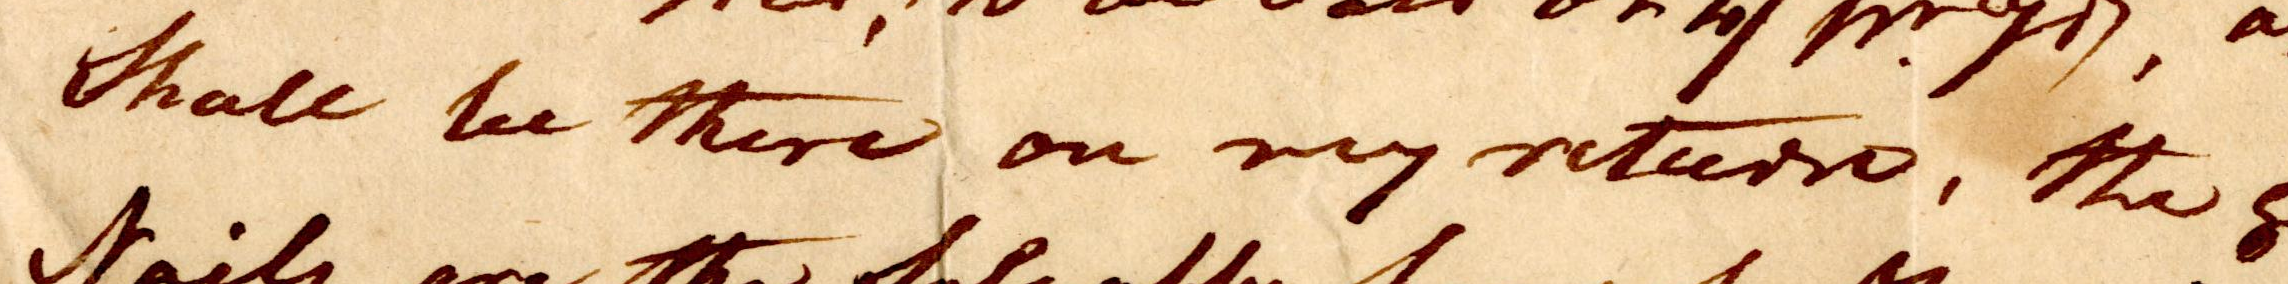shall be there on my return, the
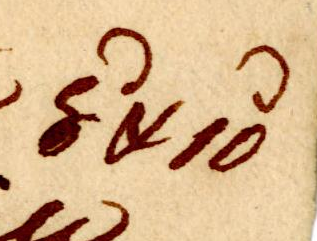8^d & 10^d
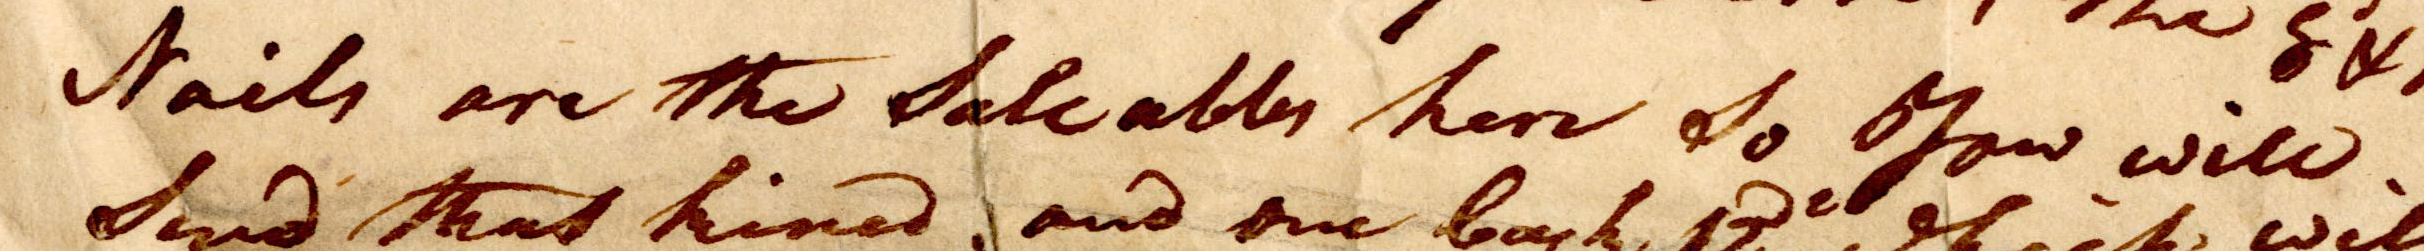Nails are the Saleables here So you will
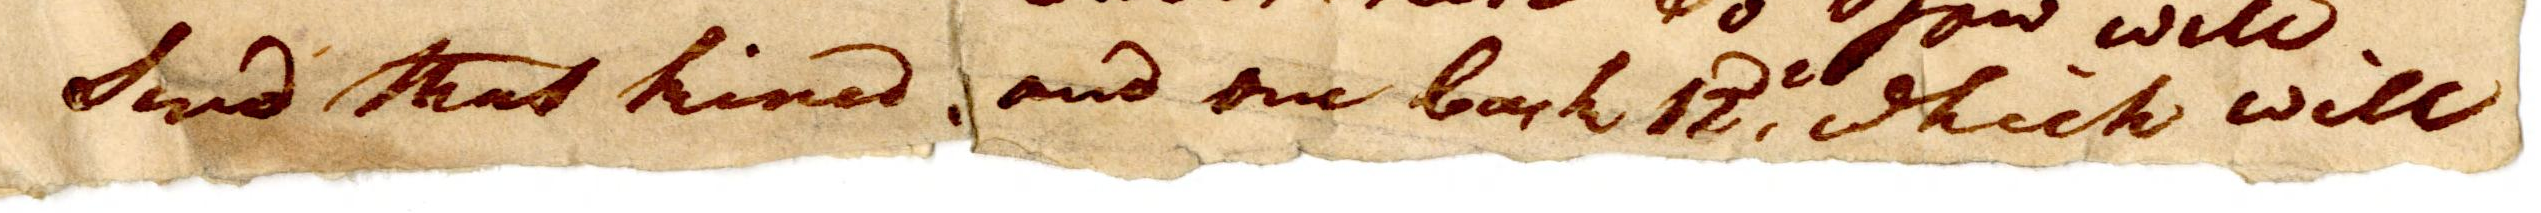find that hired and one cash, 17^e Thick will
